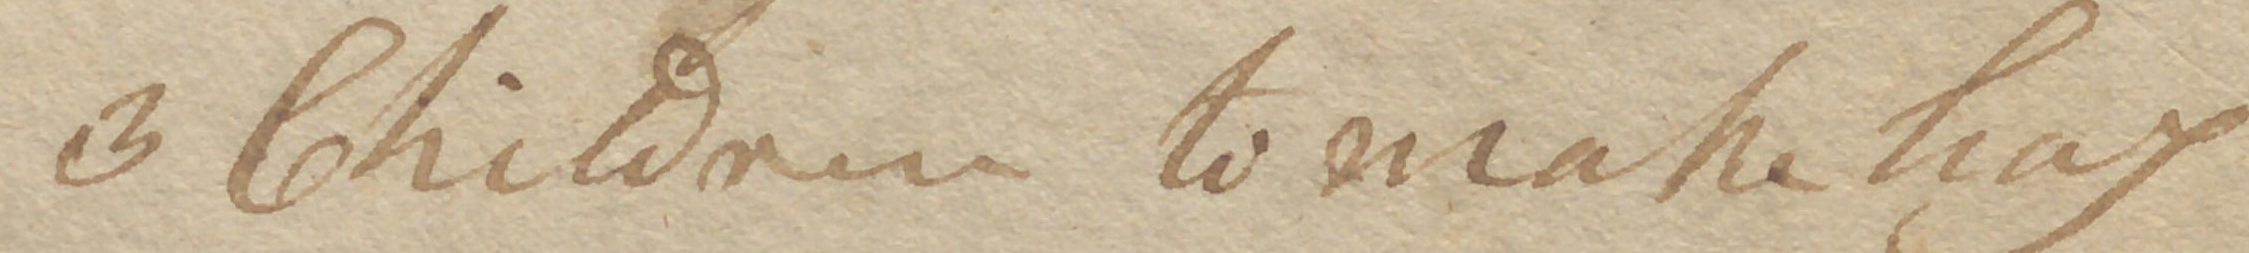3 Children to make hay
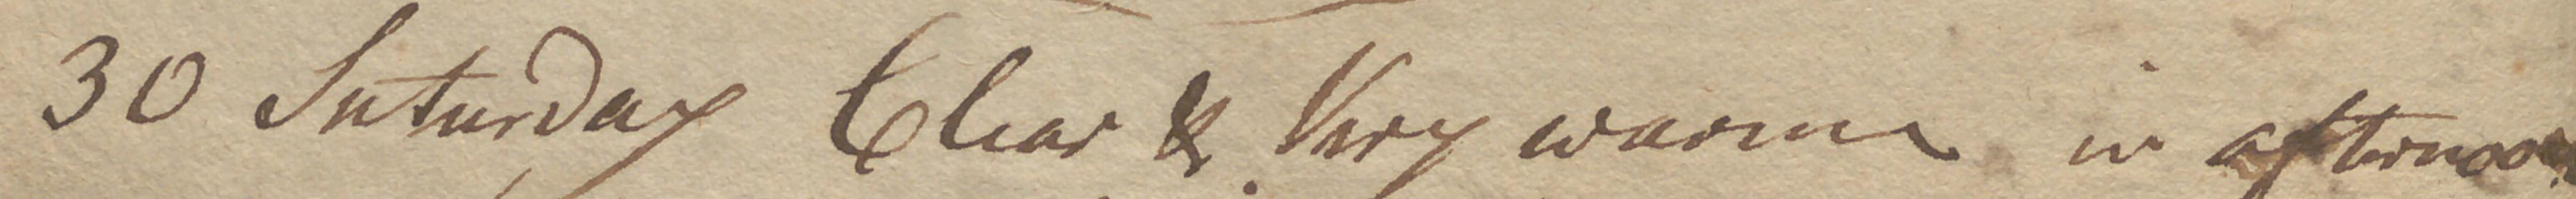30 Saturday Clear & Very warm in afternoon
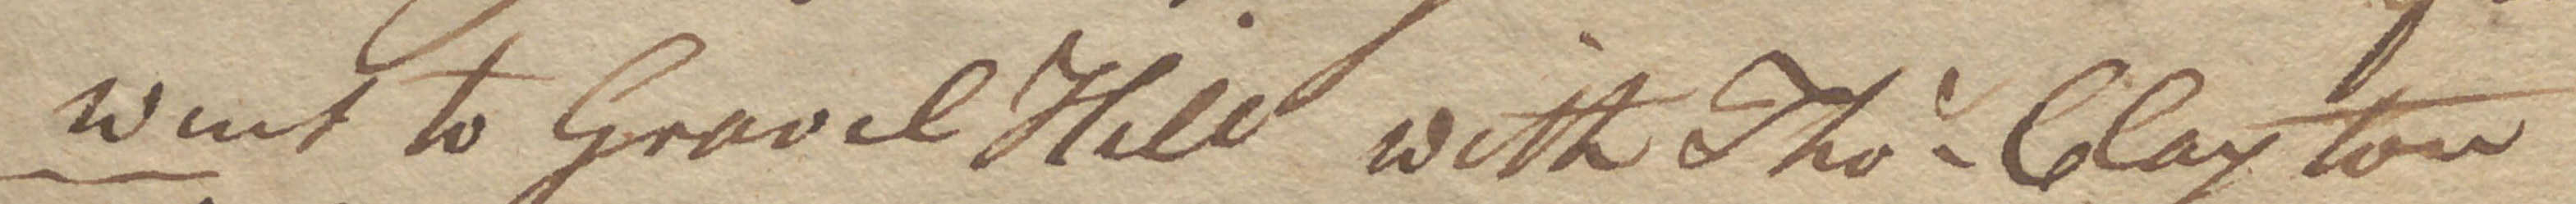went to Gravel Hill with Tho^s. Clayton
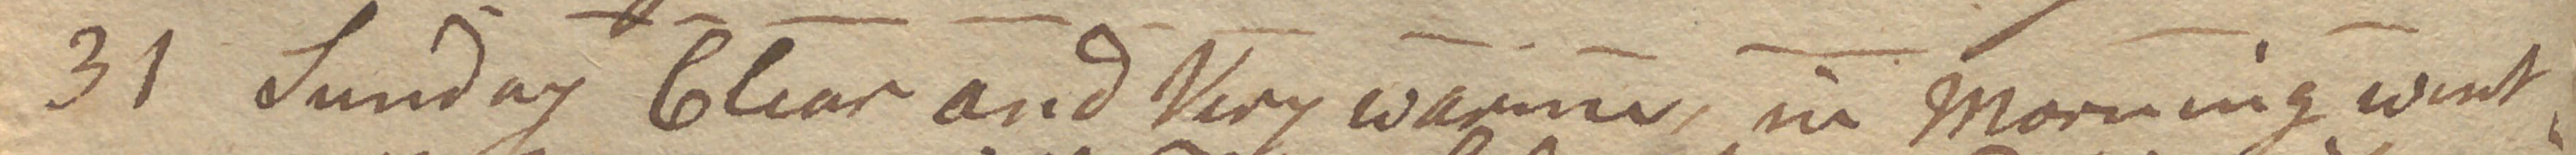31 Sunday Clear and Very warme, in morning went
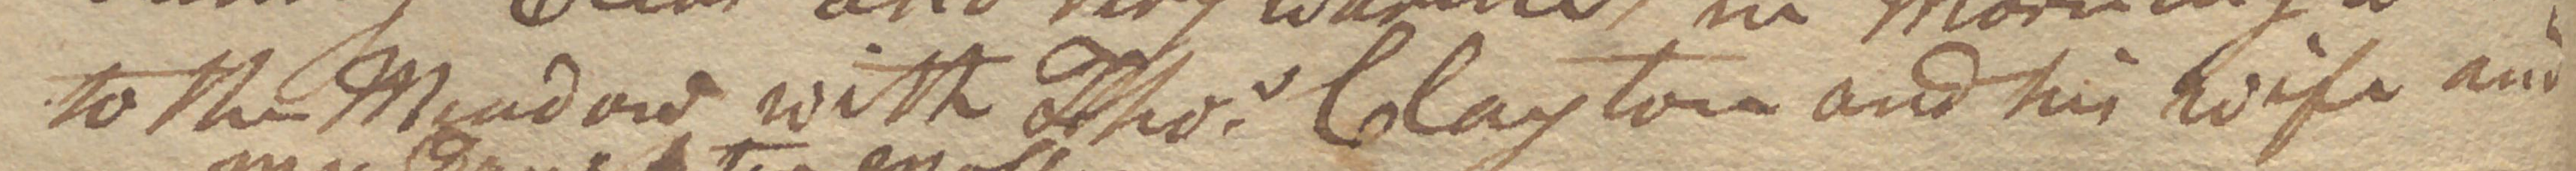to the Meadow with Tho^s. Clayton and his wife an
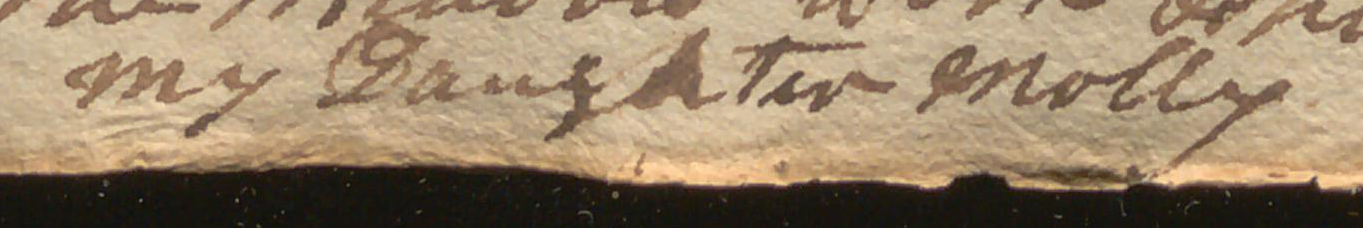my Daugatar Molly
